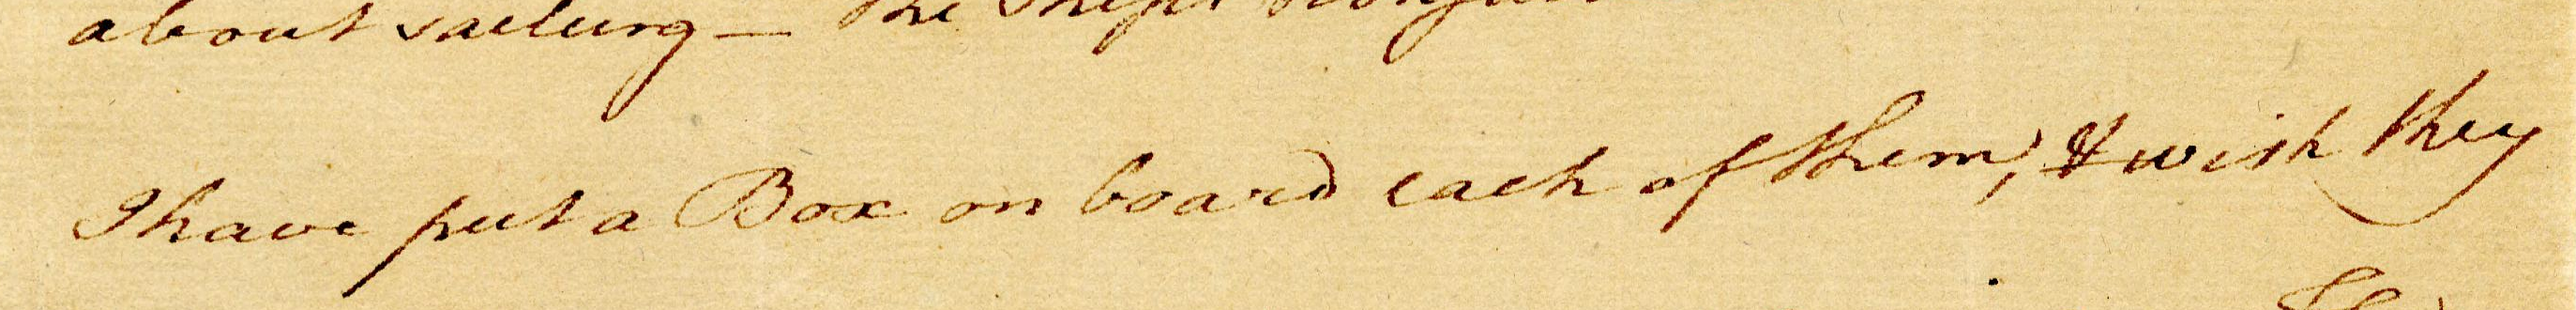I have put a Box on board each of them, & wish they
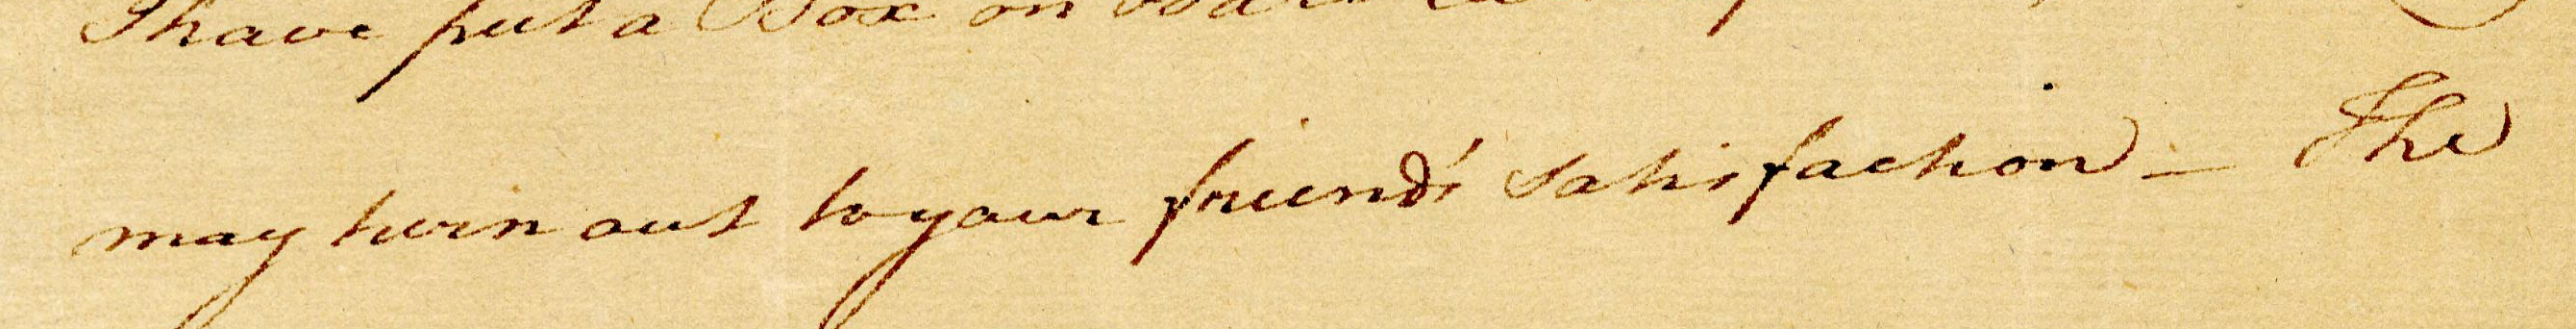may turn out to your friends satisfaction- The
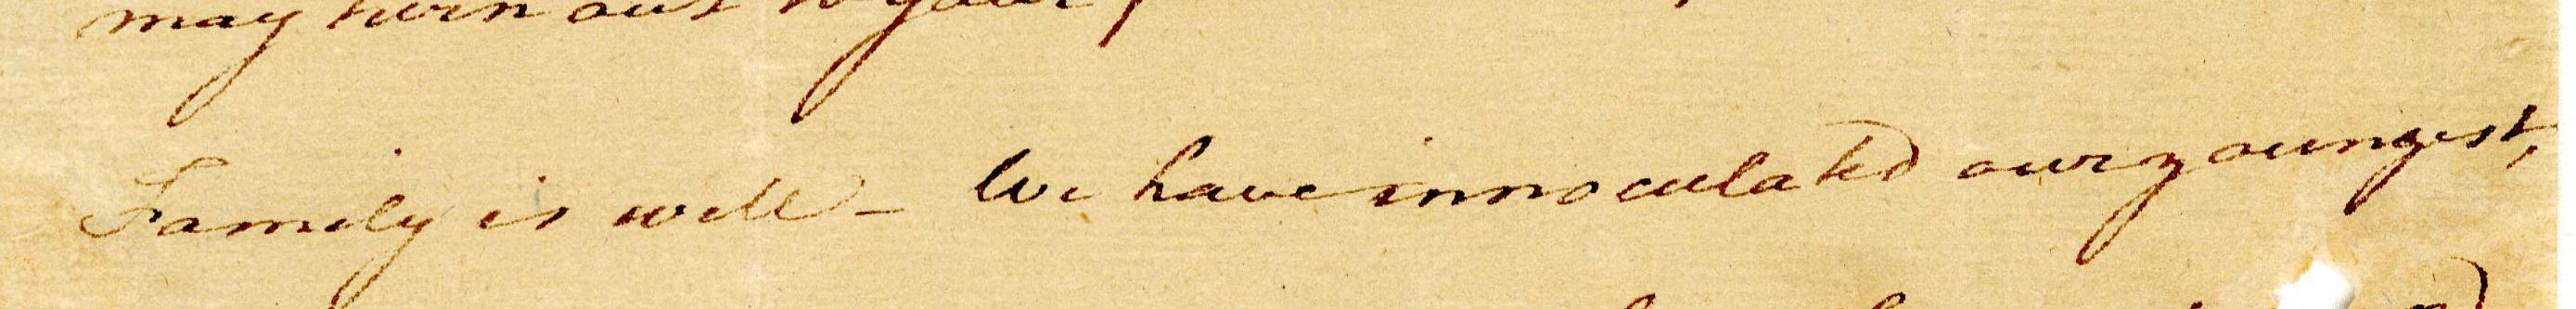Family is well- We have innoculated our youngest
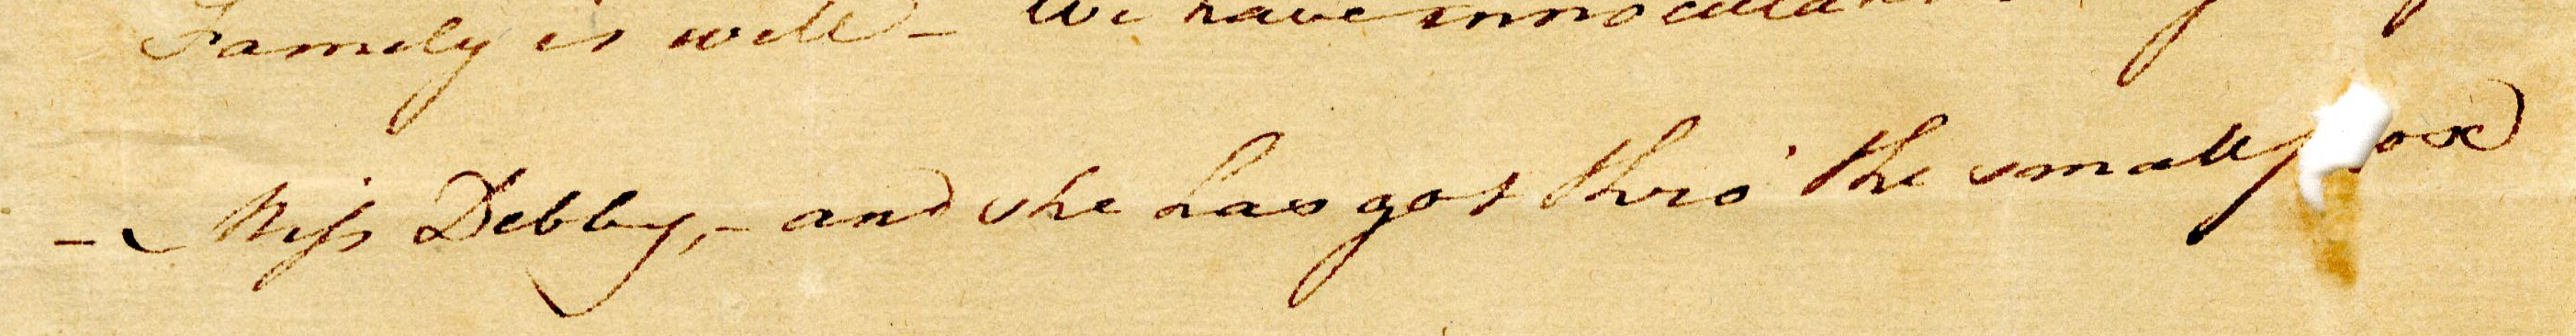-Miss Debby,- and she has got thro' the small pox
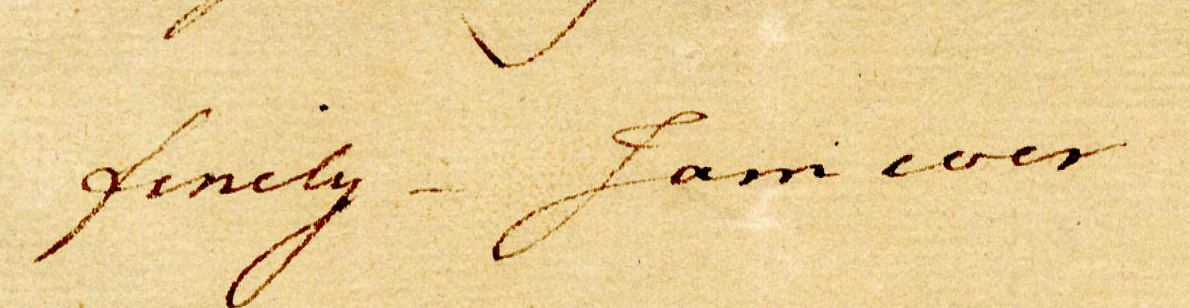finely- I am ever
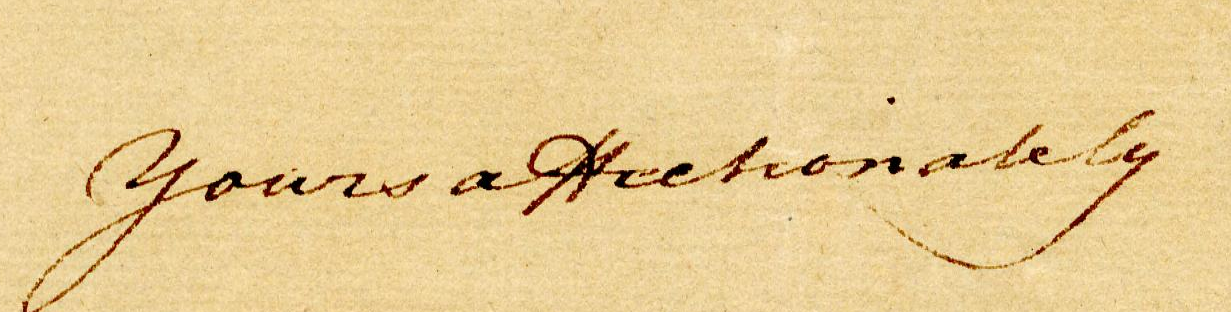Yours affectionately
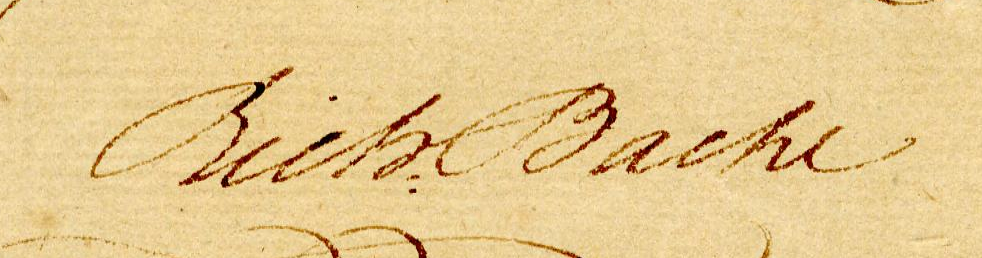Rich: Bache
